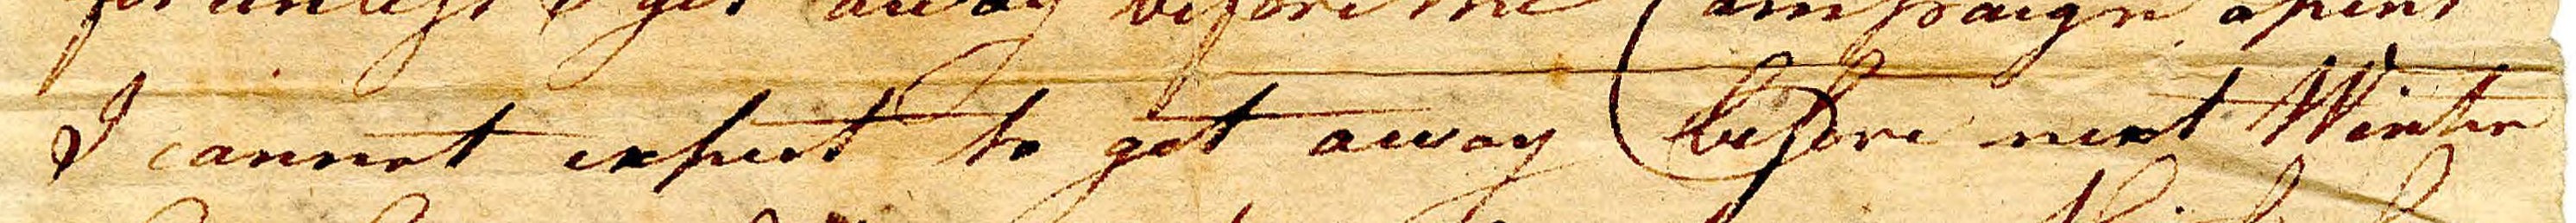I cannot expect to get away before next Winter
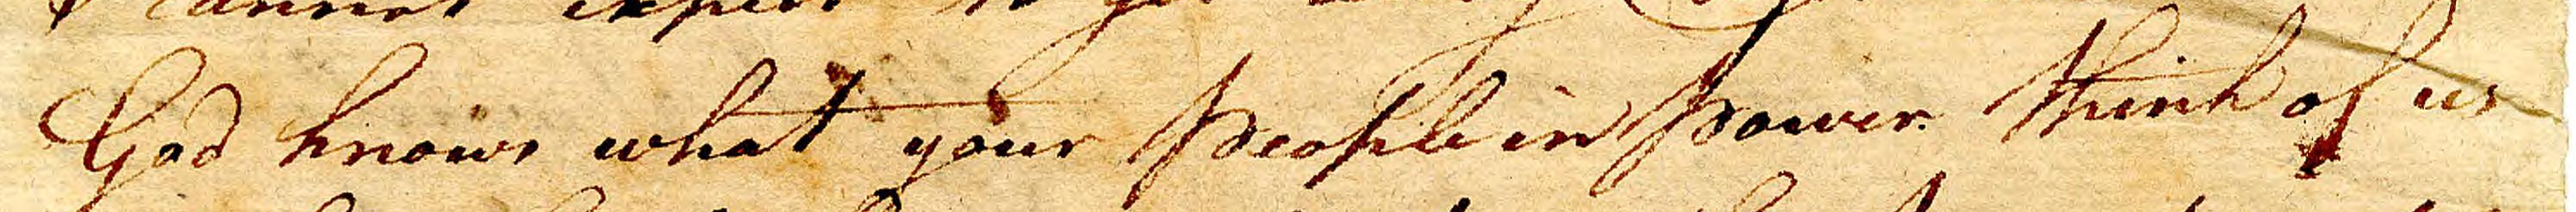God knows what your people in power think of us-
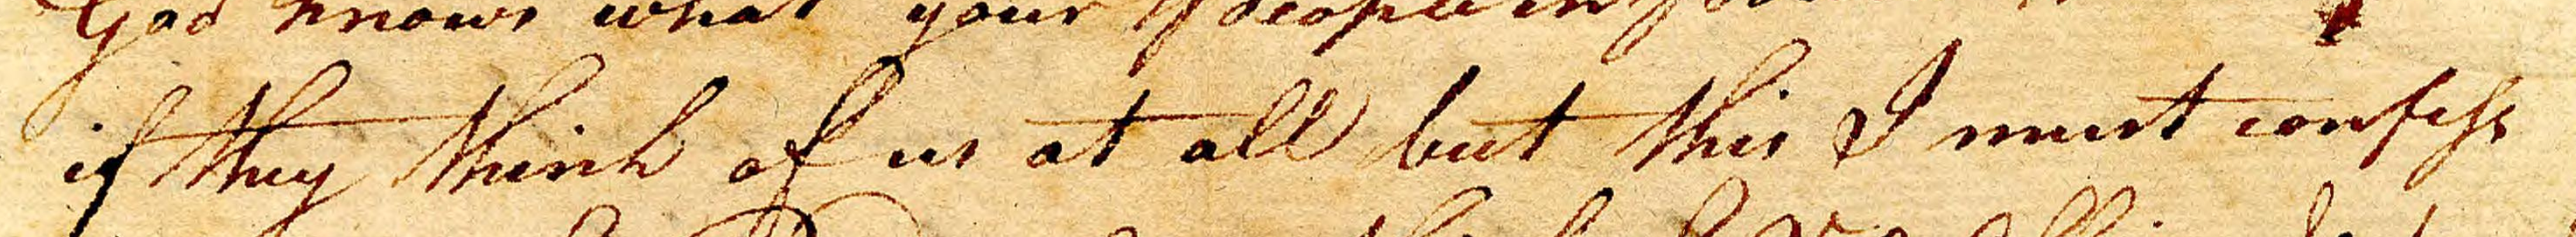if they think of us at all but this I must confess
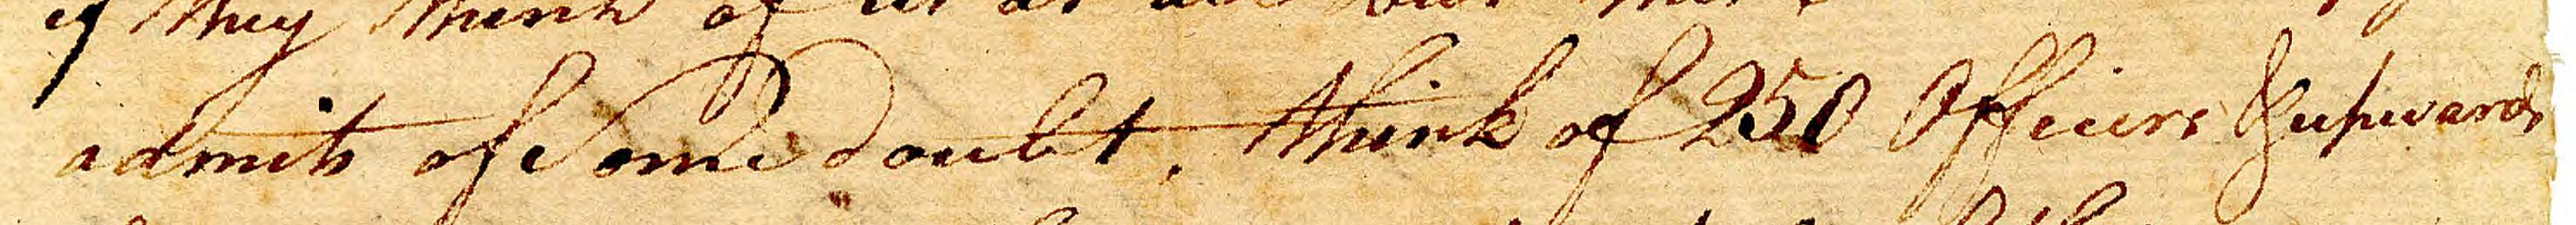admits of Some doubt. think of 250 Officers & upwards
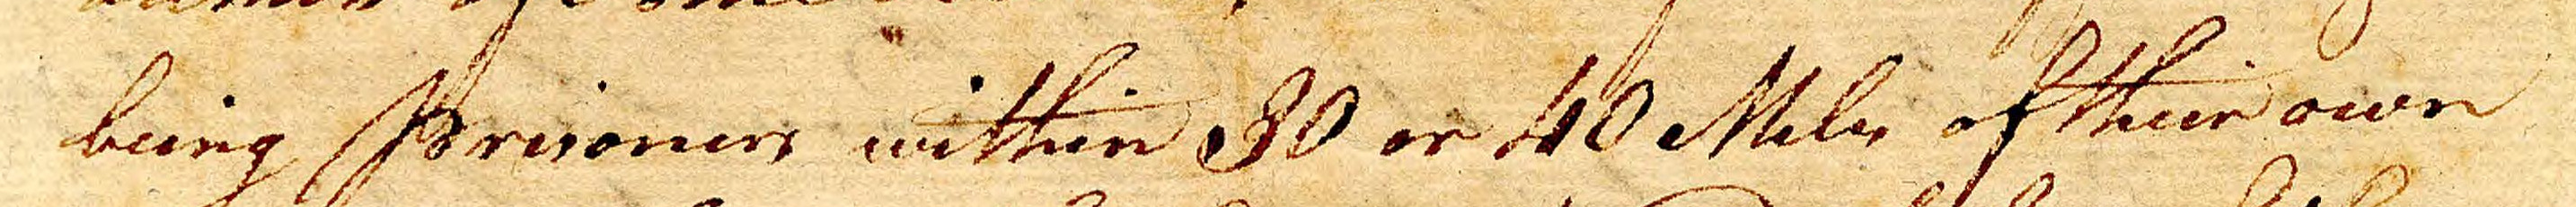being prisoners within 30 or 40 Miles of their own
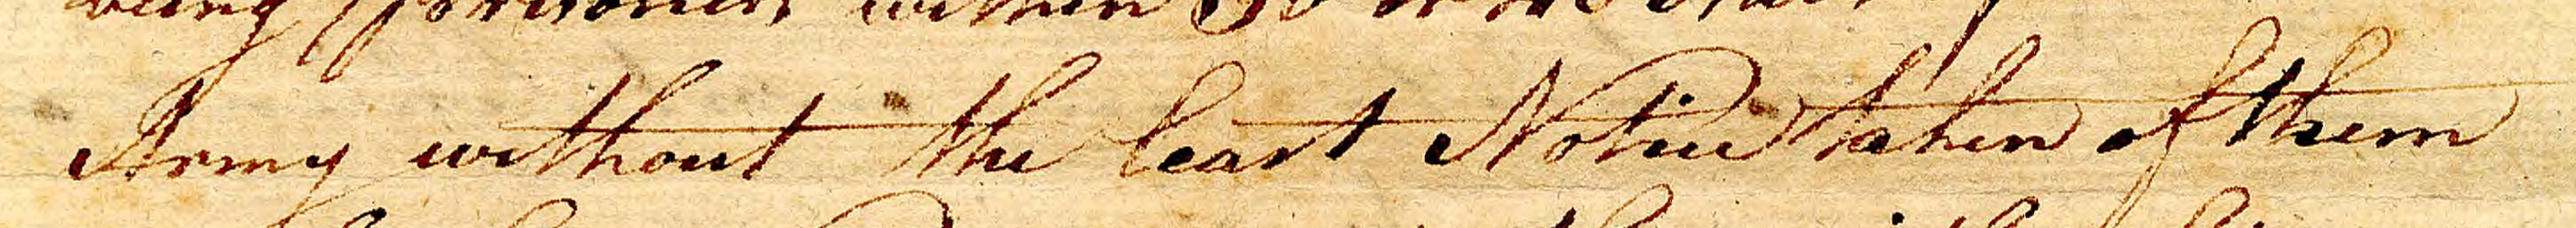Army without the least Notice taken of them
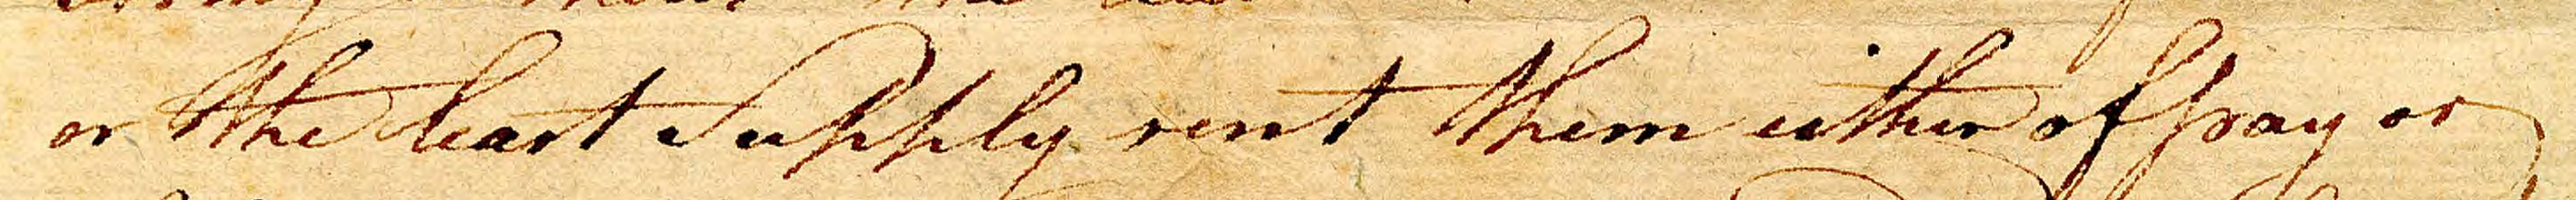or the least supply sent them either of pay or
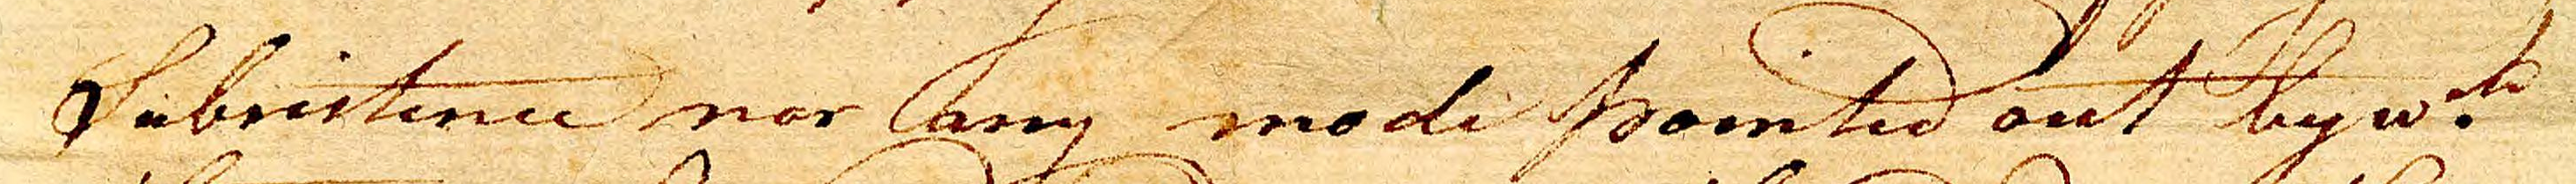Subsistence nor any mode pointed out by w^ch.
